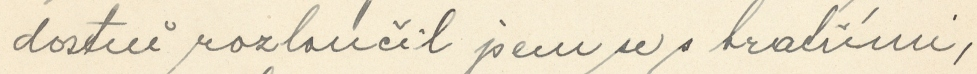dostně rozloučil jsem se s bratřími,
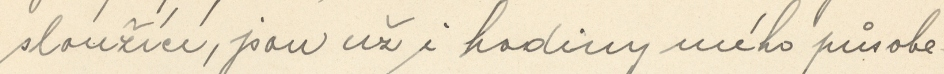sloužící, jsou už i hodiny mého působe-
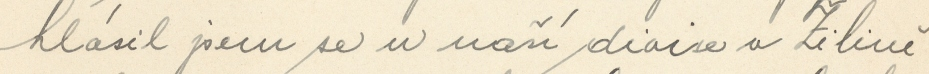hlásil jsem se u naší divise v Žilině
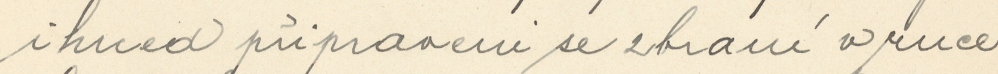ihned připraveni se zbraní v ruce
